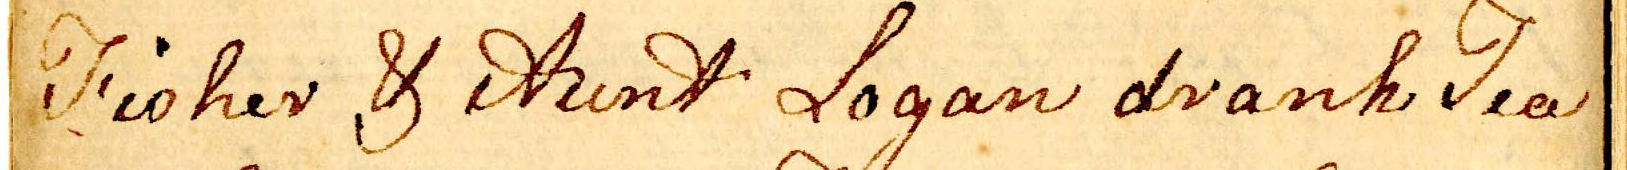Fisher & Aunt Logan drank Tea
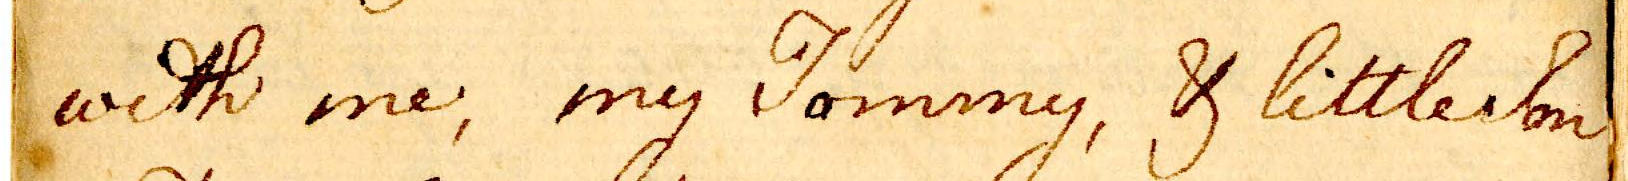with me, my Tommy, & little Son
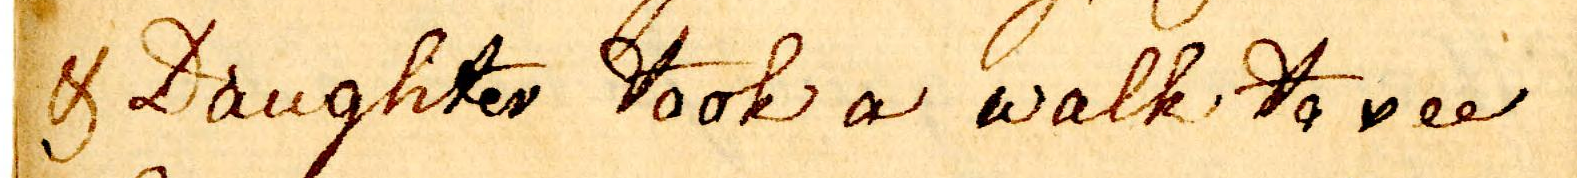& Daughter took a walk to see
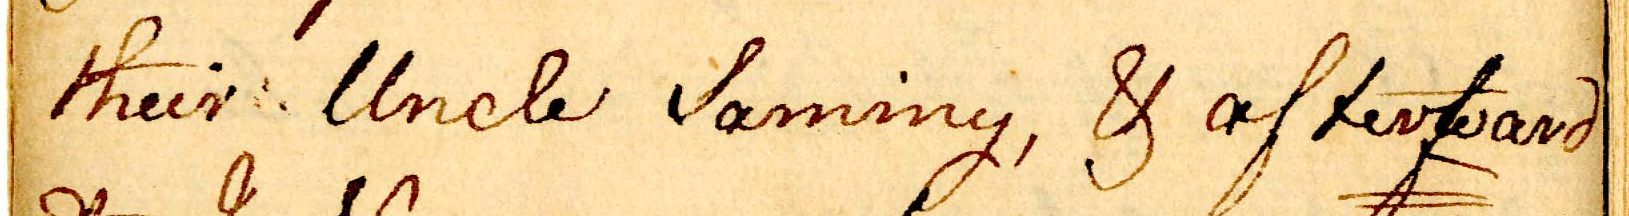their Uncle Sammy, & afterward
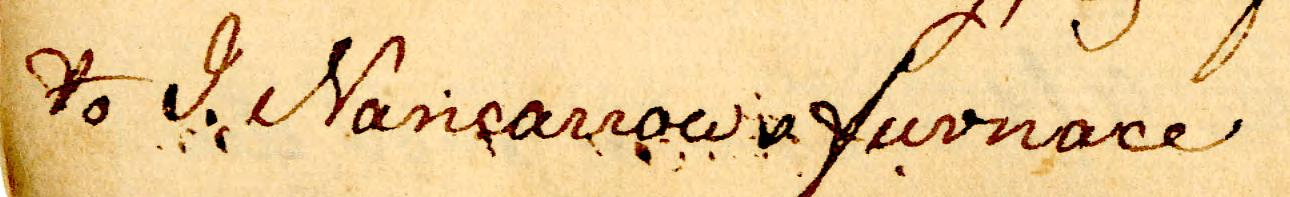to I. Nancarrow s furnace
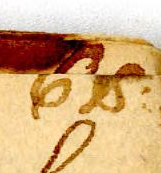61
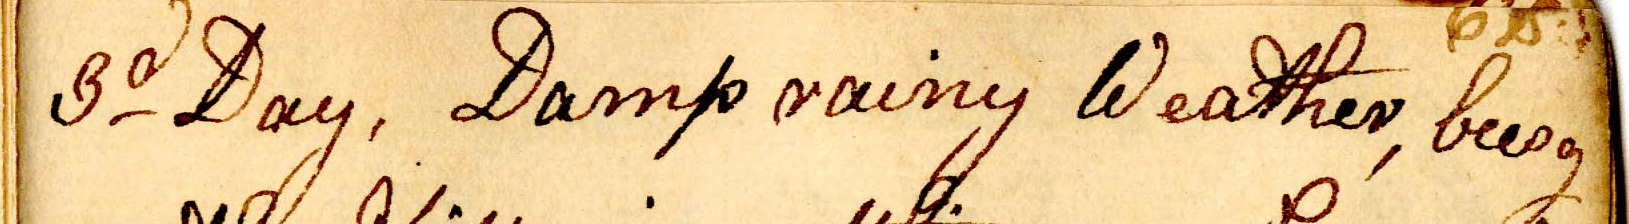3^d Day, Damp rainy Weather, busy
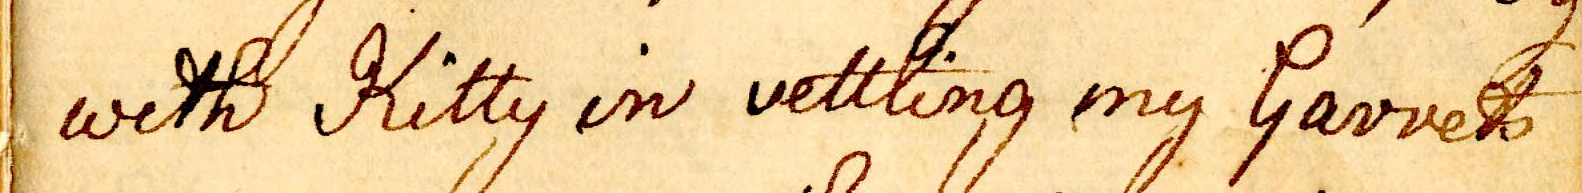with Kitty in settling my Garrets
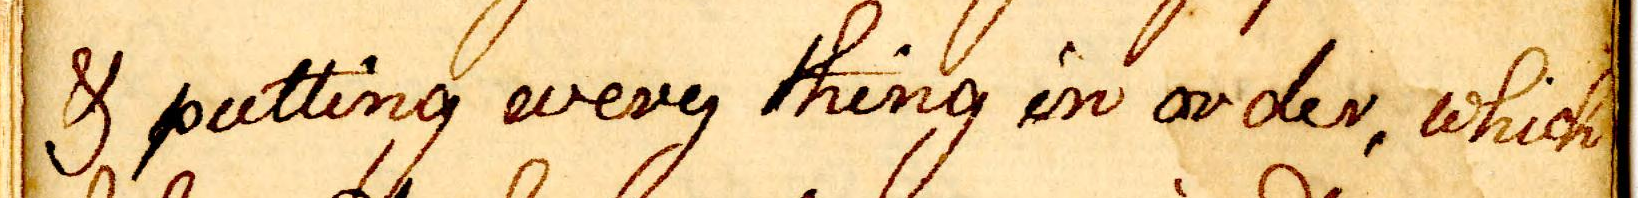& putting every thing in order, which
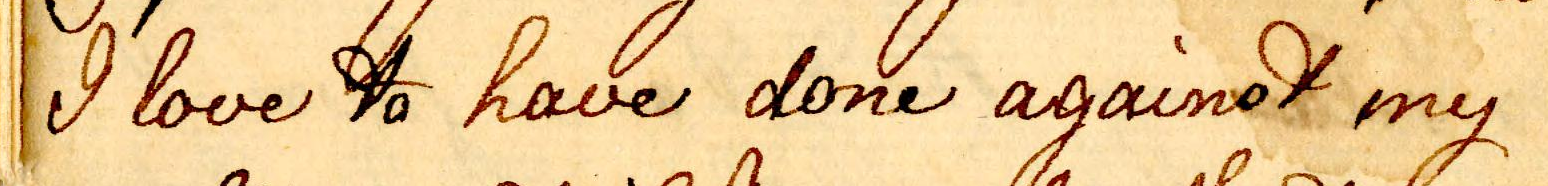I love to have done against my
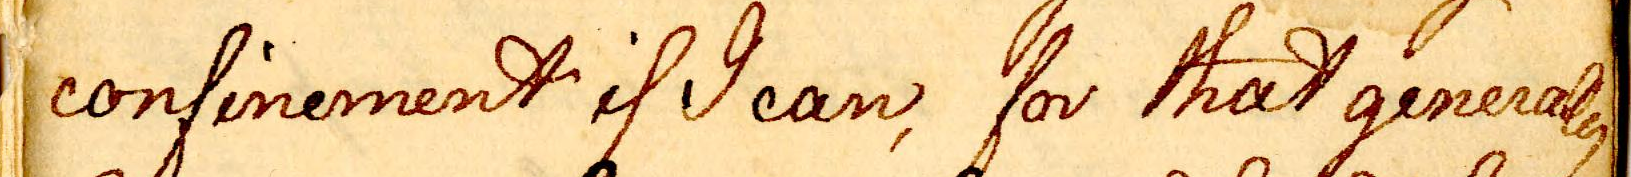confinement if I can, for that generally
